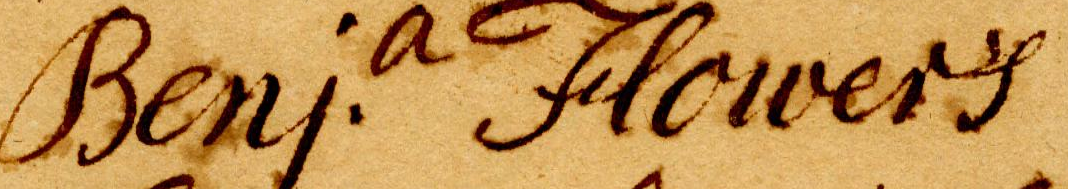Benj.^a Flowers
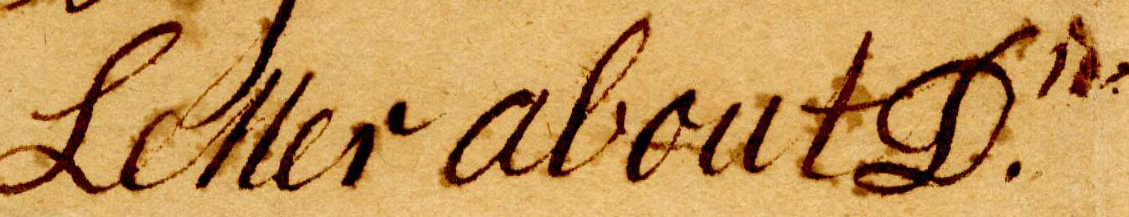Letter about D^r.
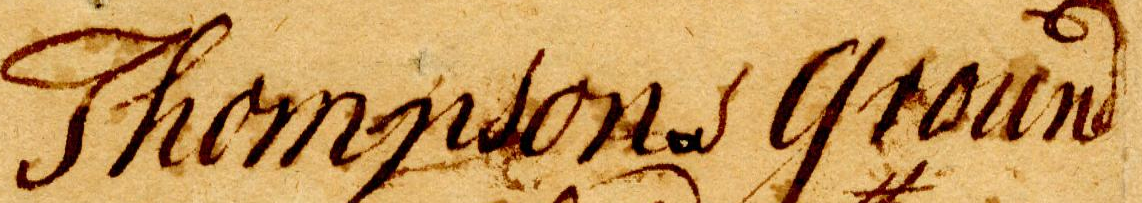Thompsons Ground
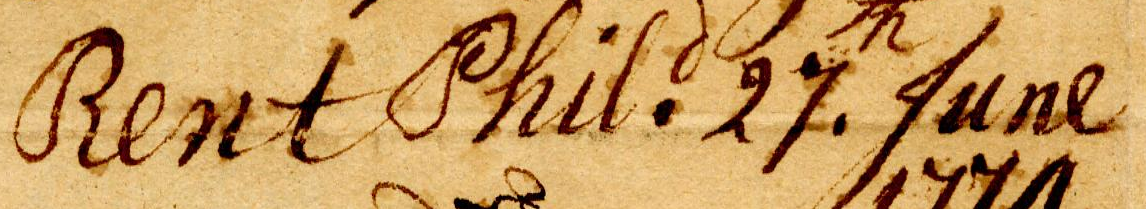Rent Phil^d. 27^th. June
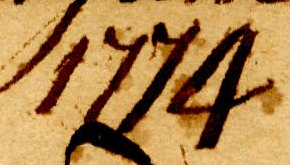1774
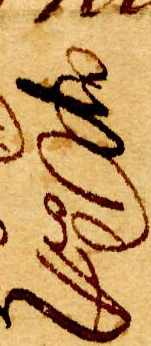per Post
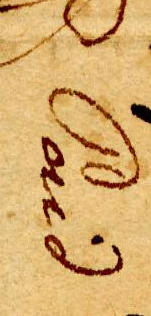Paid
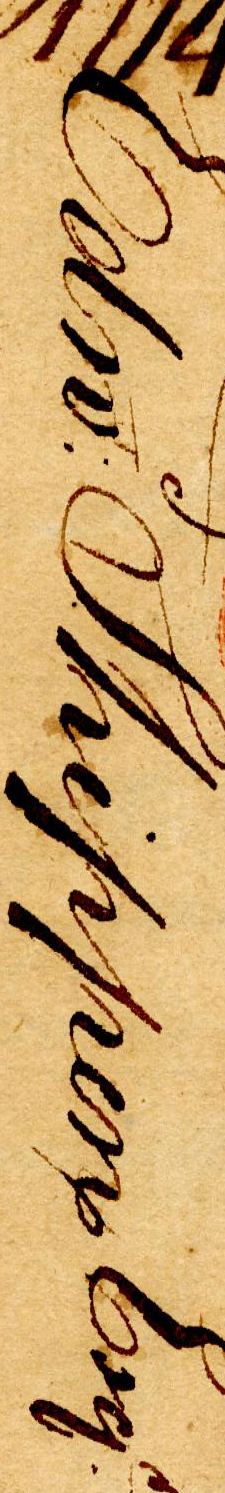Edw:^d Shippen Esq^r.
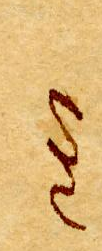in
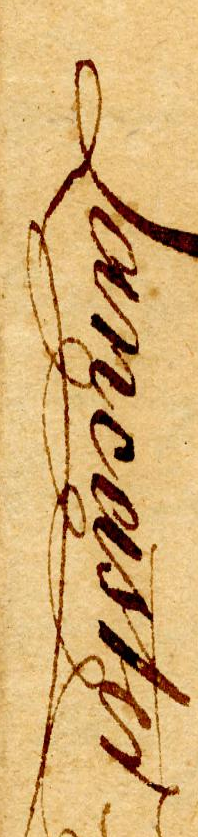Lancaster
